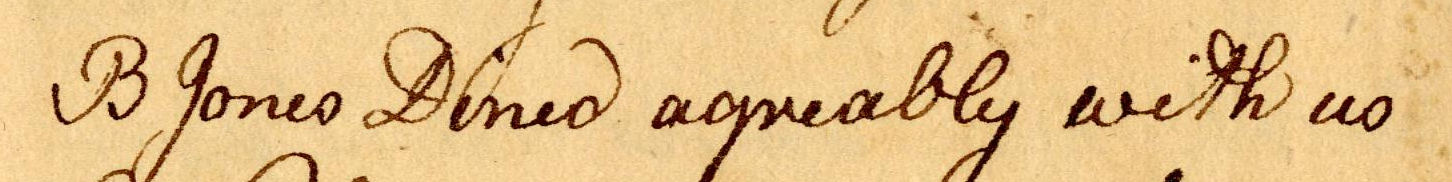B Jones Dined agreably with us
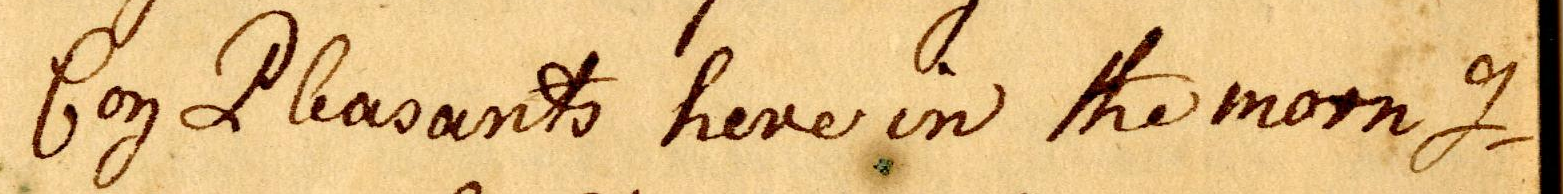Coz Pleasants here in the morn^g
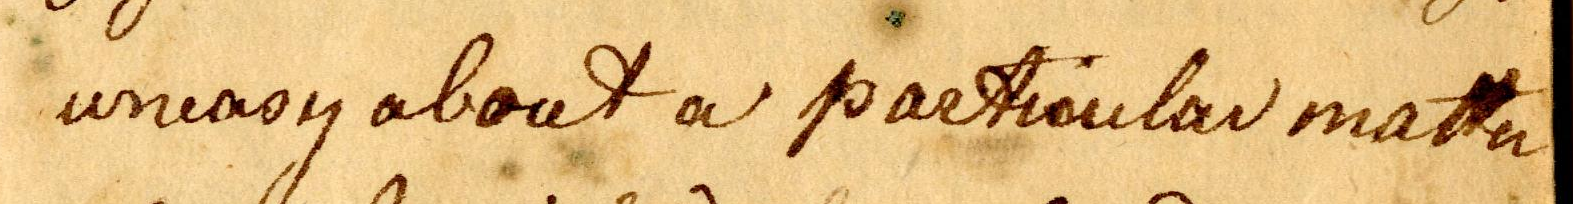uneasy about a particular matter
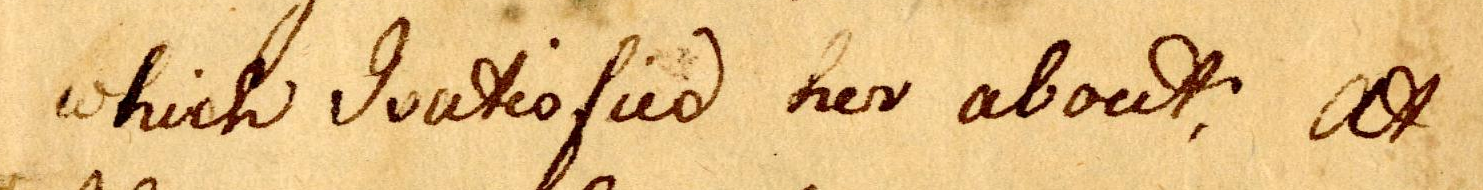which I satisfied her about, At
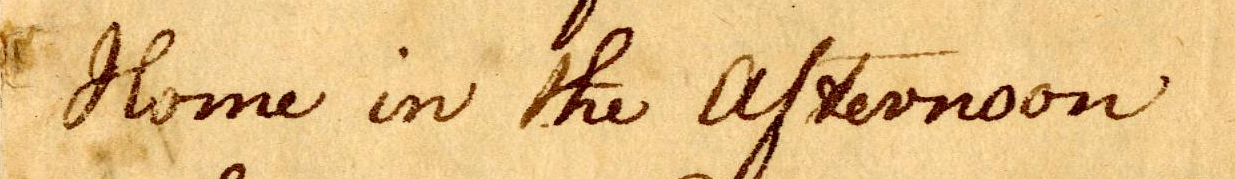Home in the Afternoon
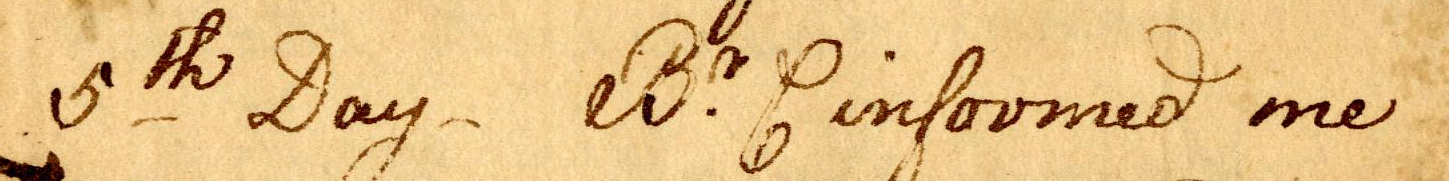5^th Day- B^r. C informed me
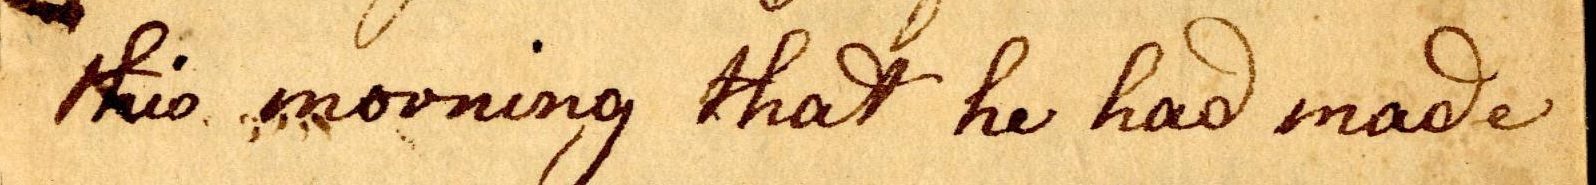this morning that he had made
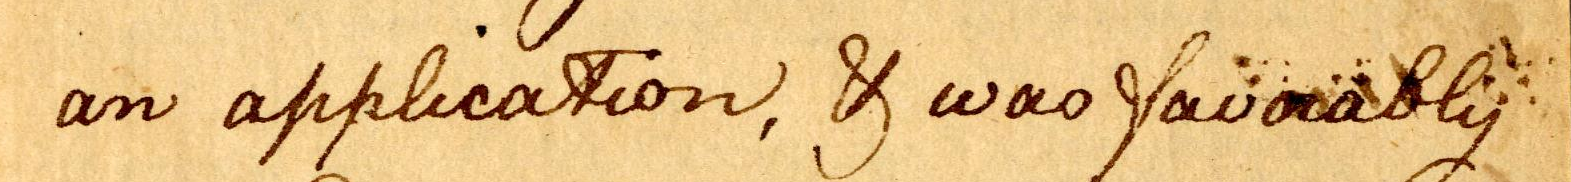an application, & was favorably
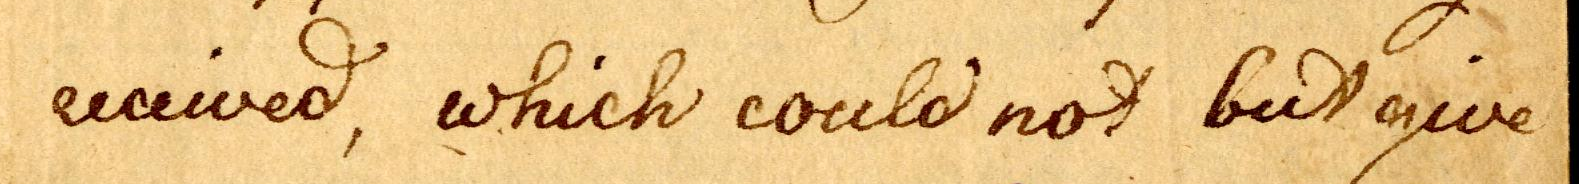received, which could not but give
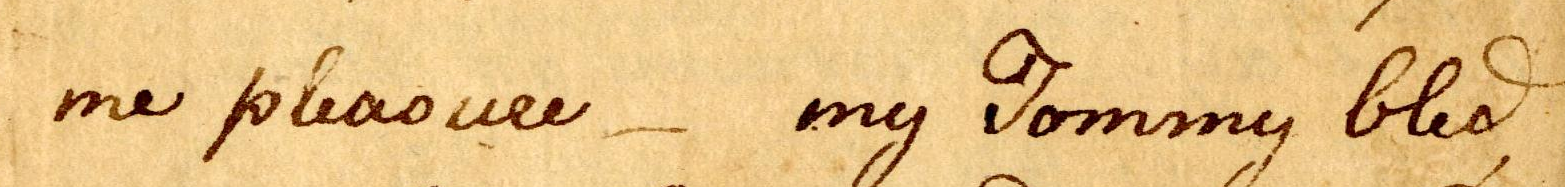me pleasure- my Tommy bled
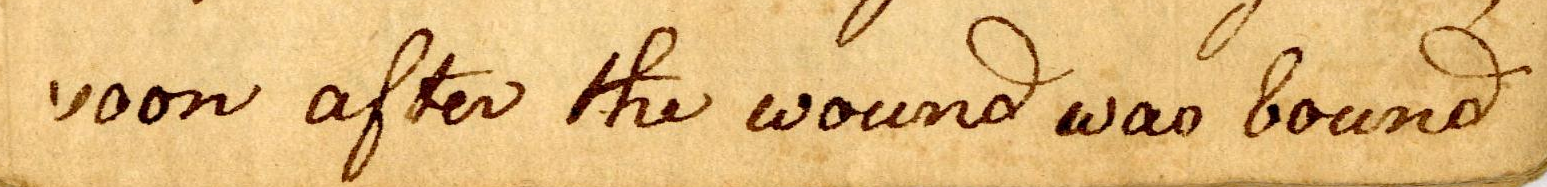soon after the wound was bound
